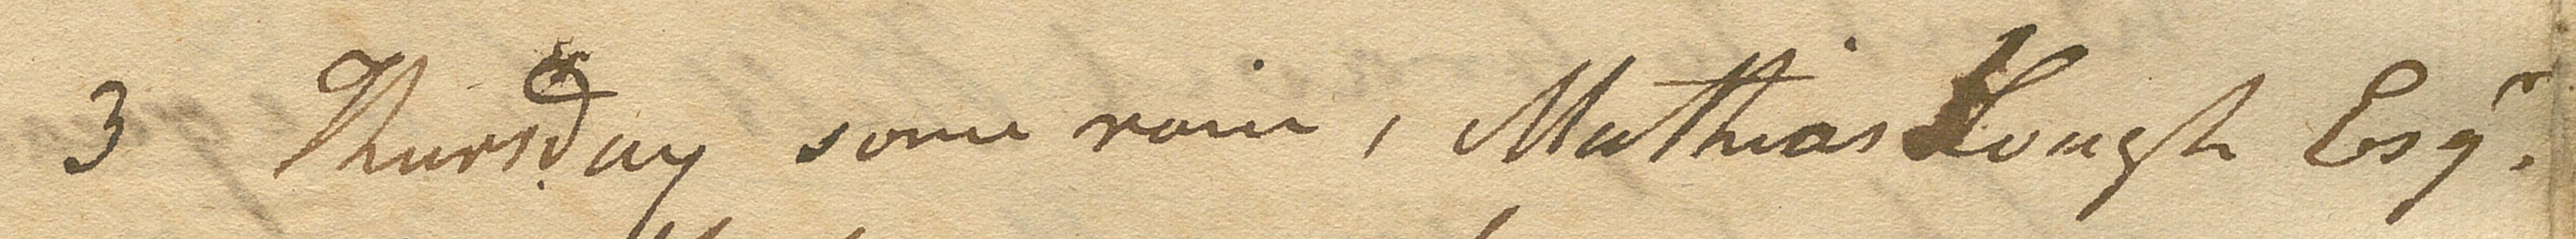3 Thursday some rain, Mathias Lough Esq^r.
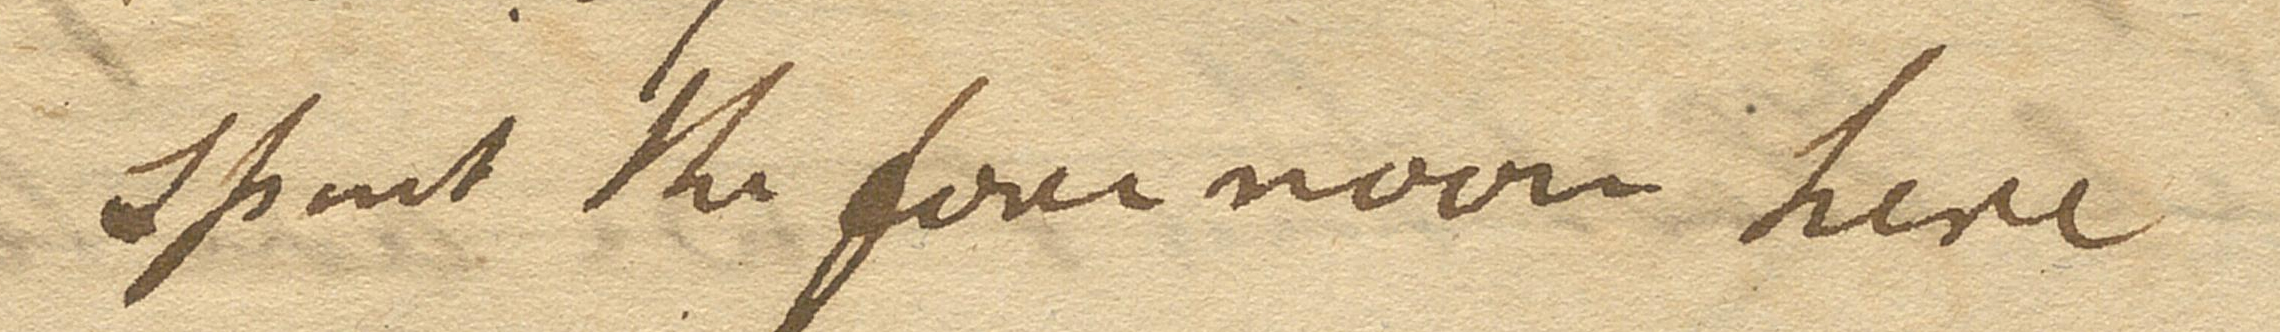spent the forenoon here
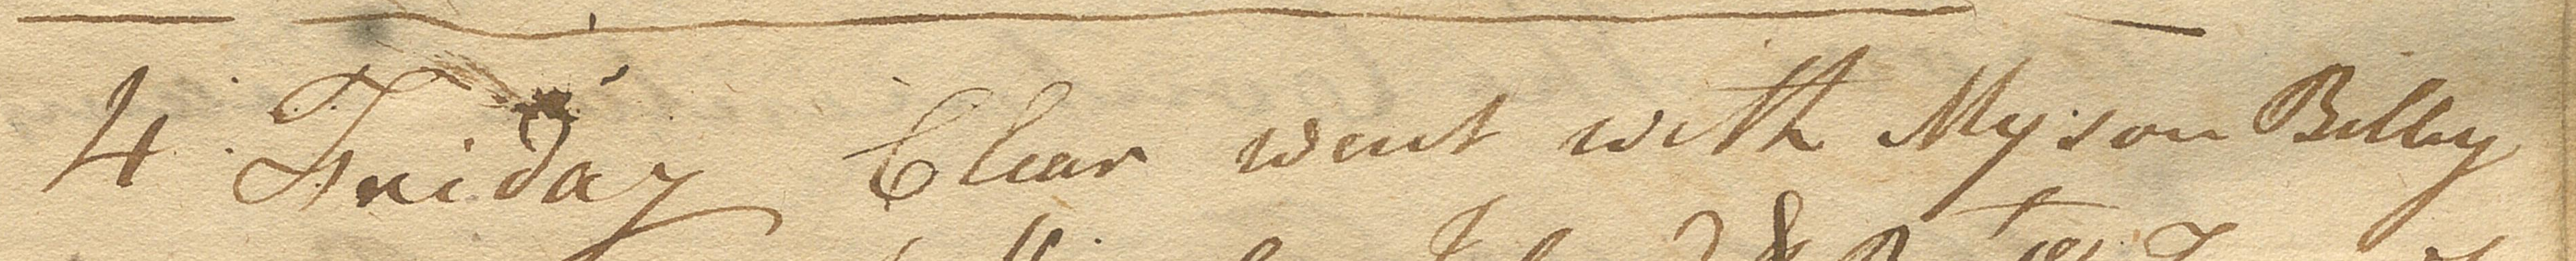4 Friday. Clear went with My son Billey
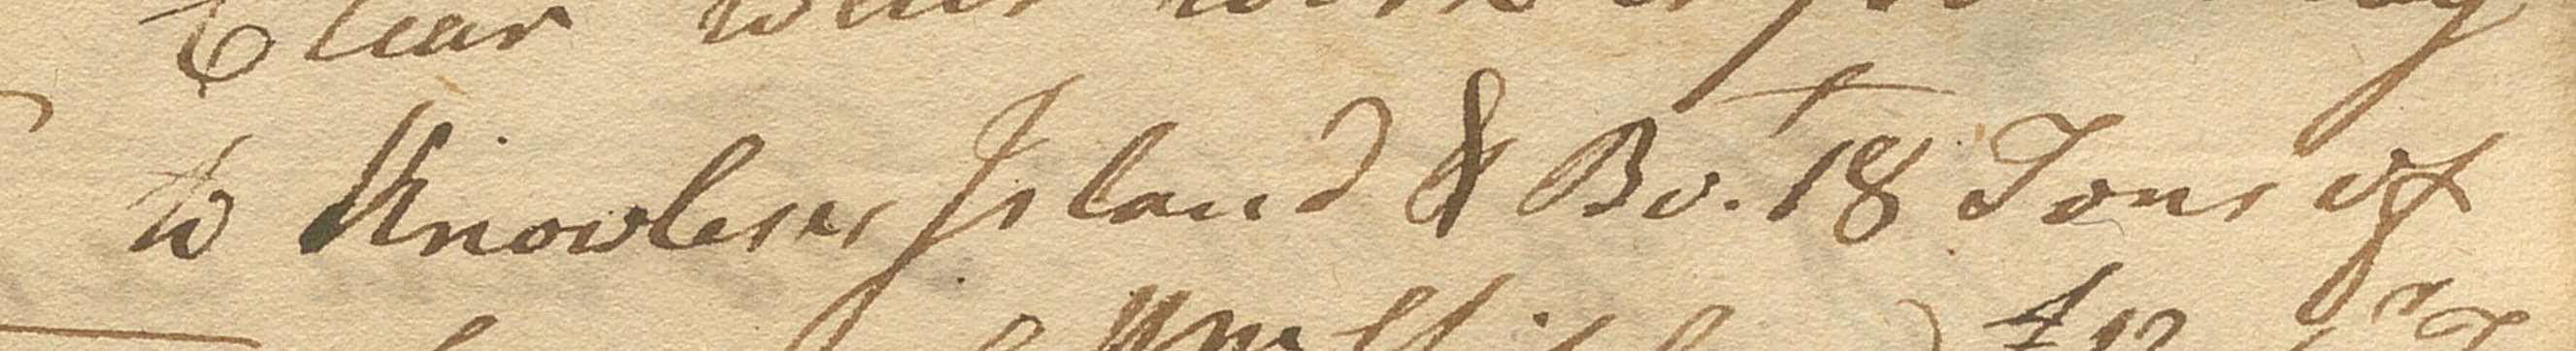to Knowleses Island & Bo^t. 18 Tons of
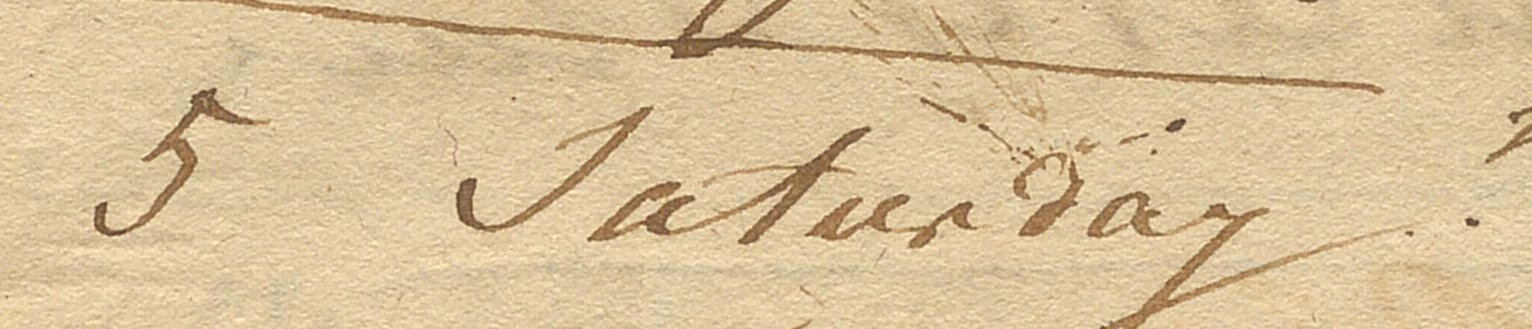5 Saturday
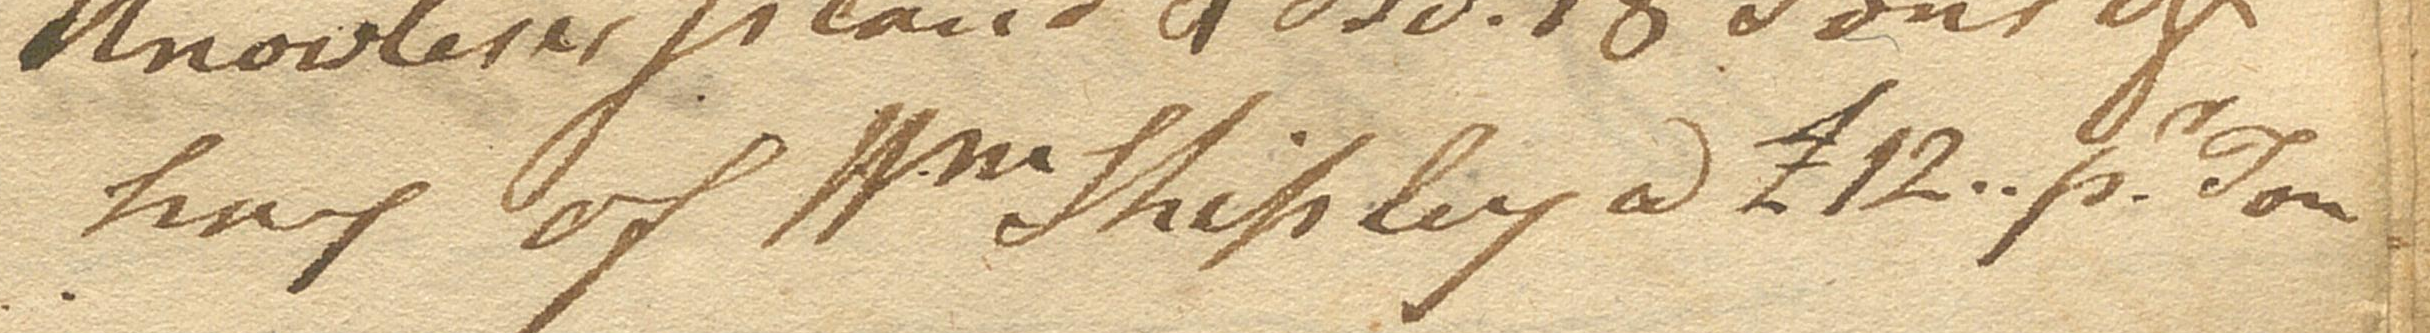hay of W^m. Shipley @ £12. p^r. Ton
